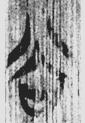谷（欲）
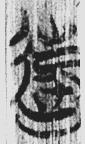速
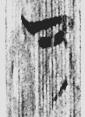乃
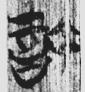許
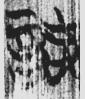諾
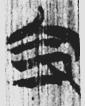命
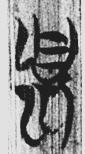須
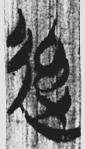○（後）
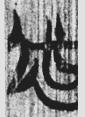佖
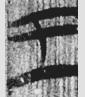王
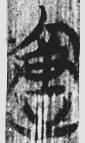○（就）
